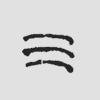三
